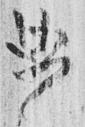足
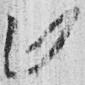㠯（以）
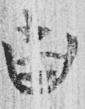古（固）
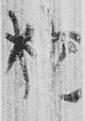材
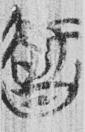○（知）
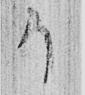人
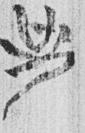足
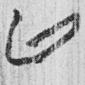㠯（以）
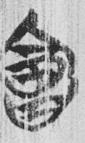會
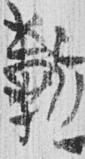新（親）
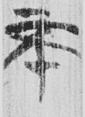不
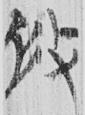攸（修）
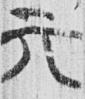亓
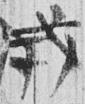成
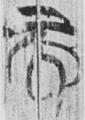而
